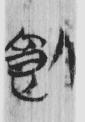飤
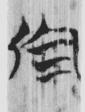於
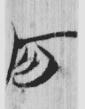戶
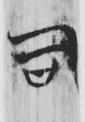司
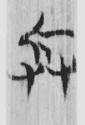兵
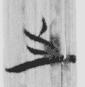之
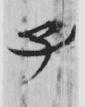子
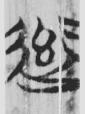{行糸止}
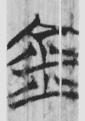金
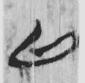㠯（以）
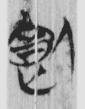飤
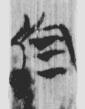於
